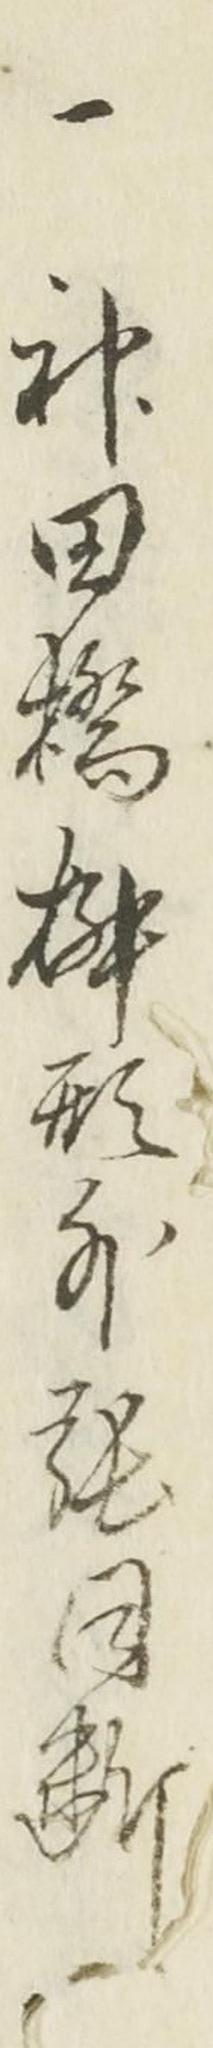一神田橋枡形外張同断
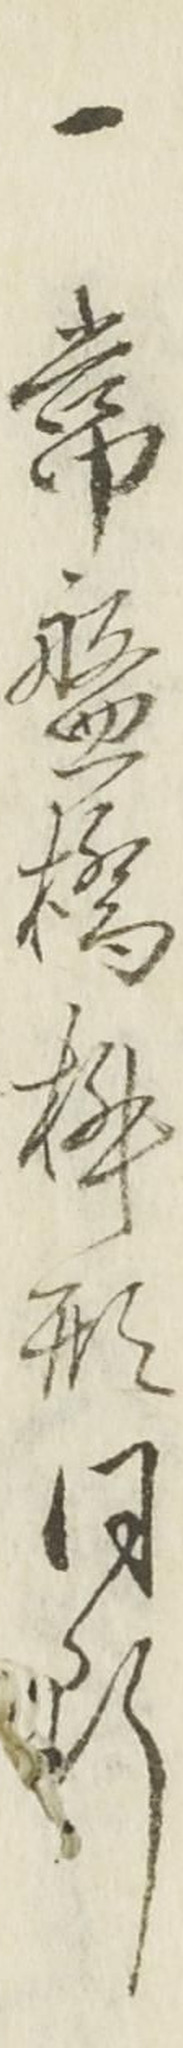一常盤橋枡形同断
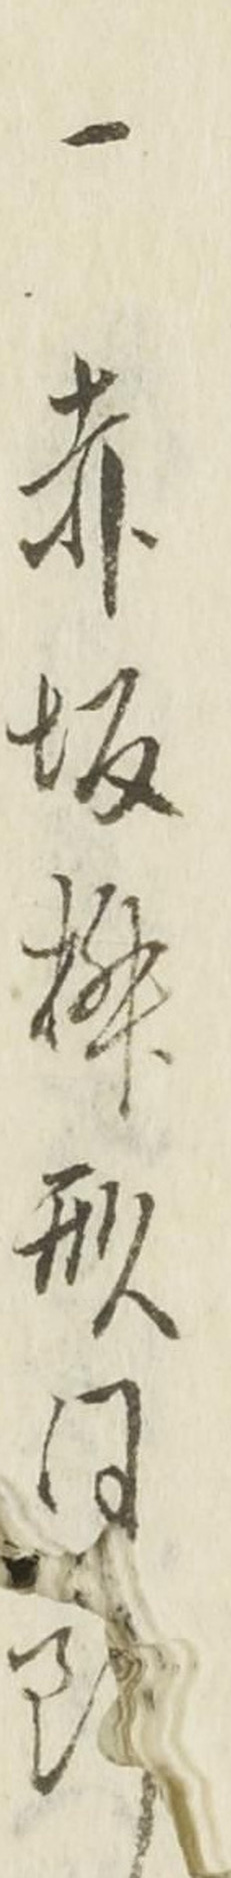一赤坂枡形同断
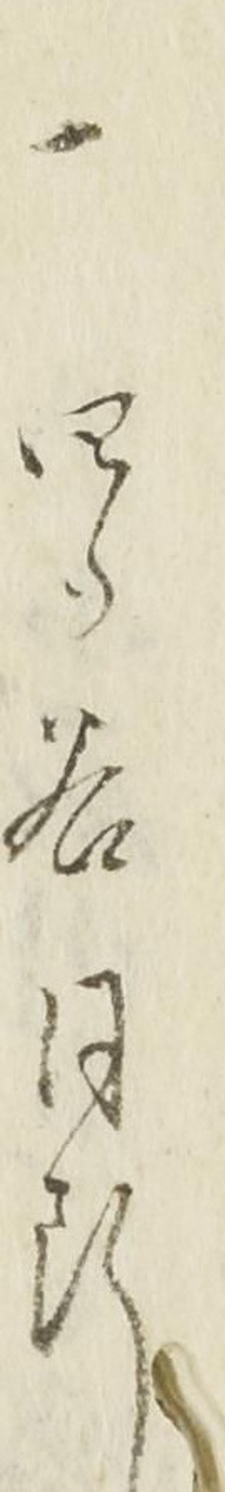一四ツ谷同断
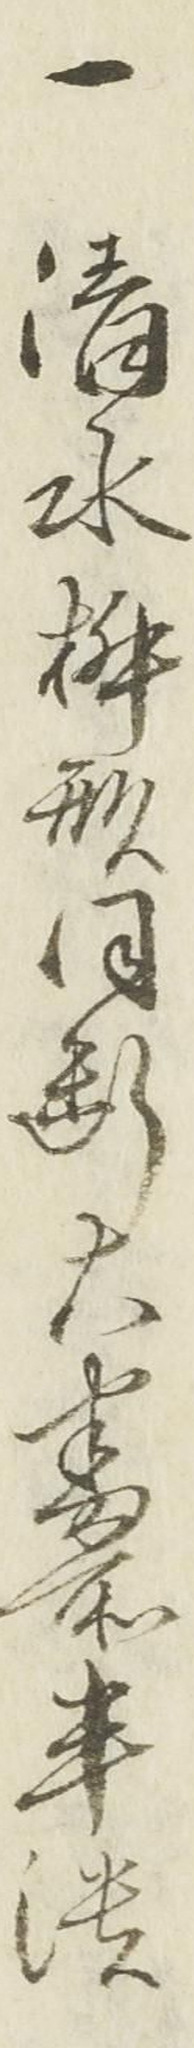一清水枡形同断大番所半潰滅
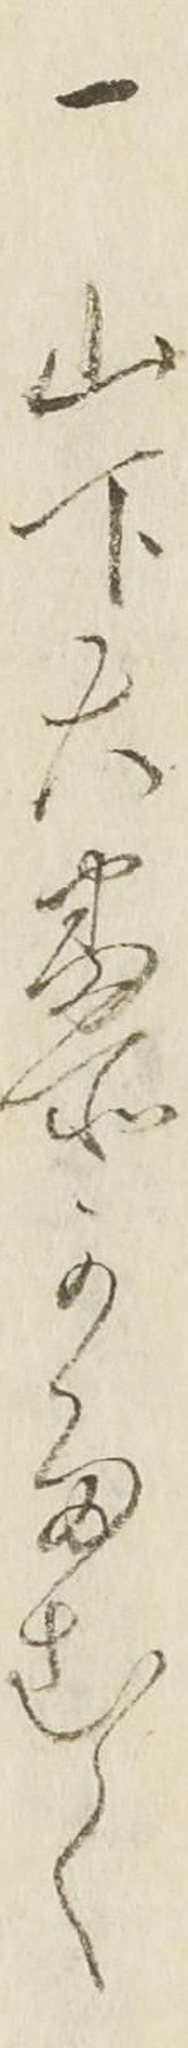一山下大番所可多むく
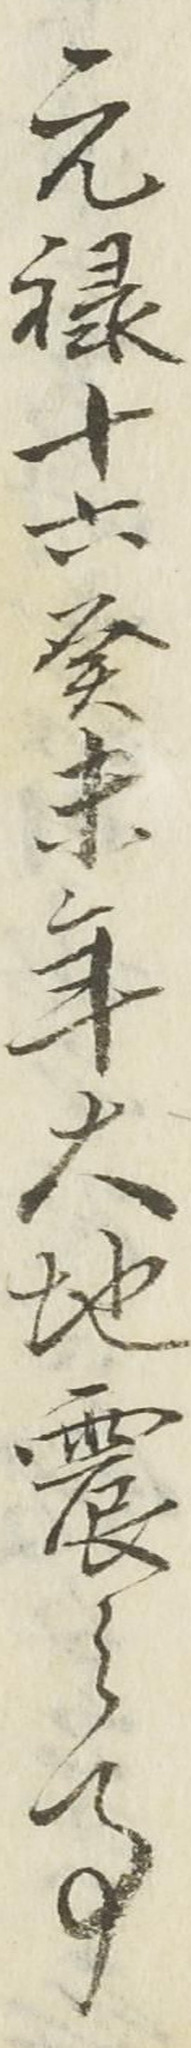元禄十六年癸未都市大地震之事
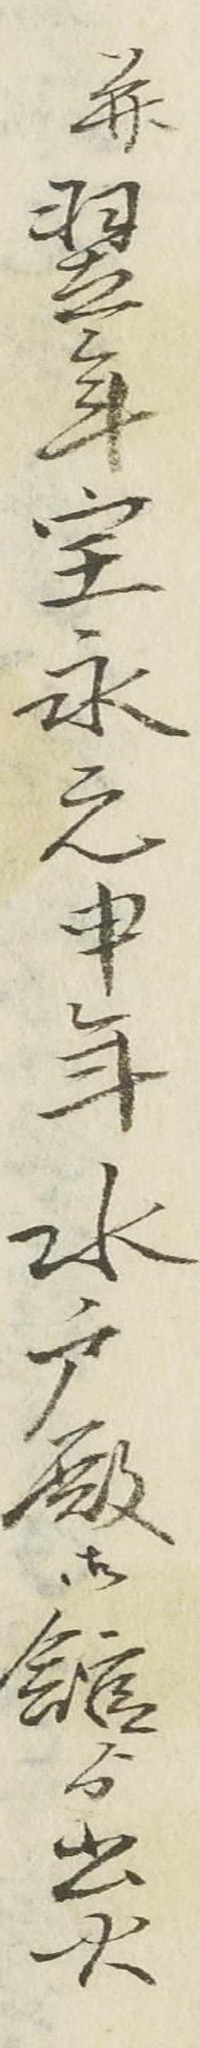幷翌年宝永元申年水戸殿御館ゟ出火
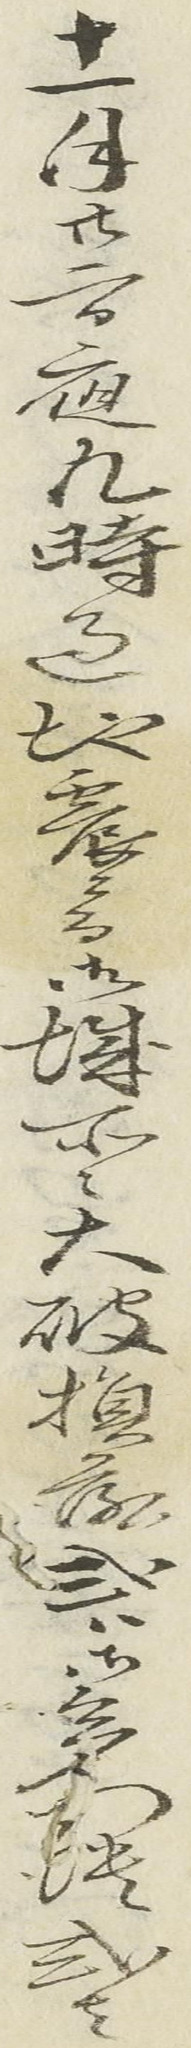十一月廿二日夜九時過地震ニ而御城所々大破損落或ハ御多門潰或は
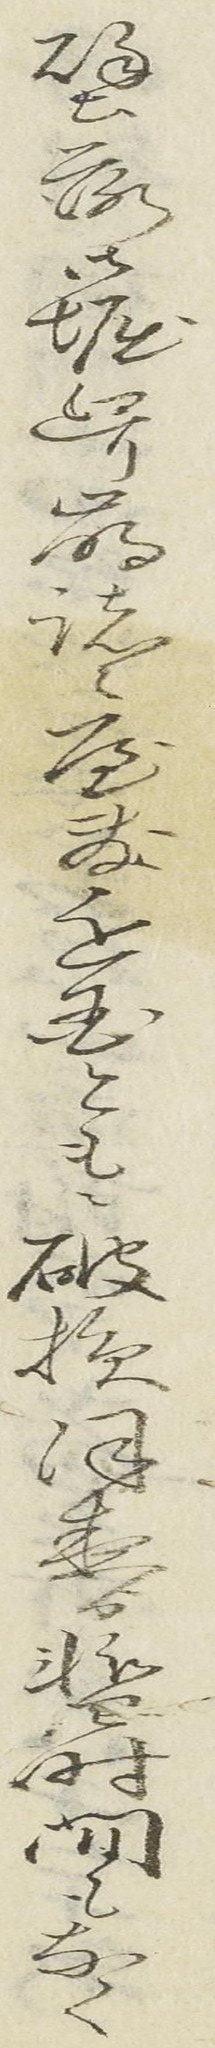壁落御堀廻り崩諸々屋敷近国ともニ破損同夜ゟ暫時間もなく
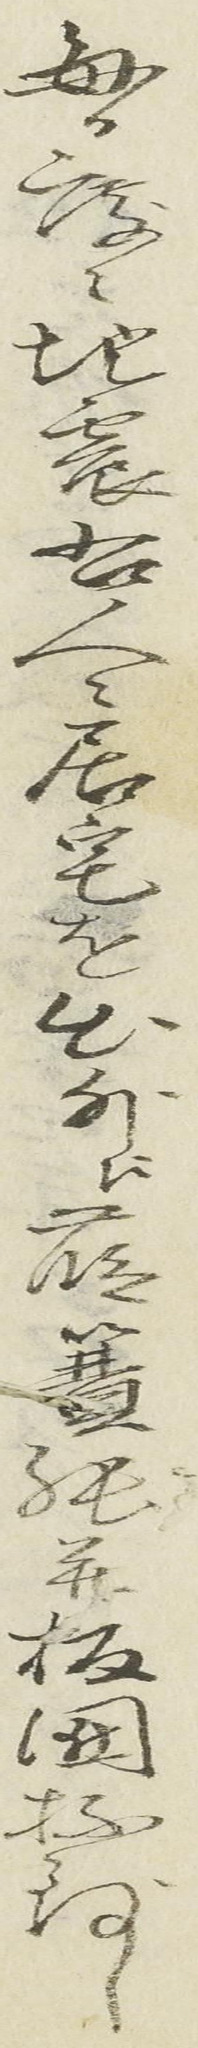毎日度々地震右人々居宅を出外ニ葭簀張幷板囲抔致し
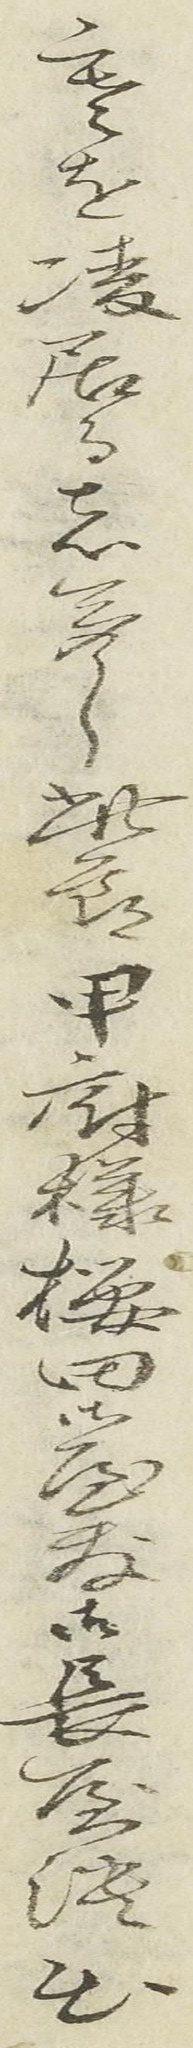寒を凌居る者多し此節甲府様桜田御屋敷御長屋潰出

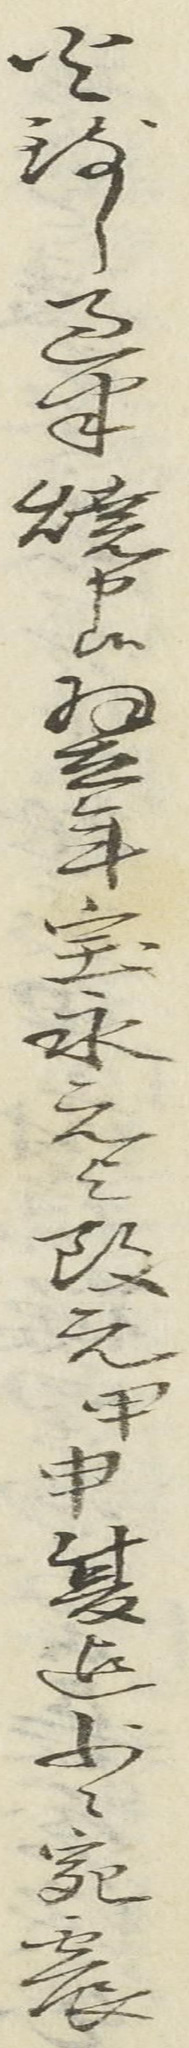火致し過半焼申候翌年宝永元と改元甲申夏迄少々宛震
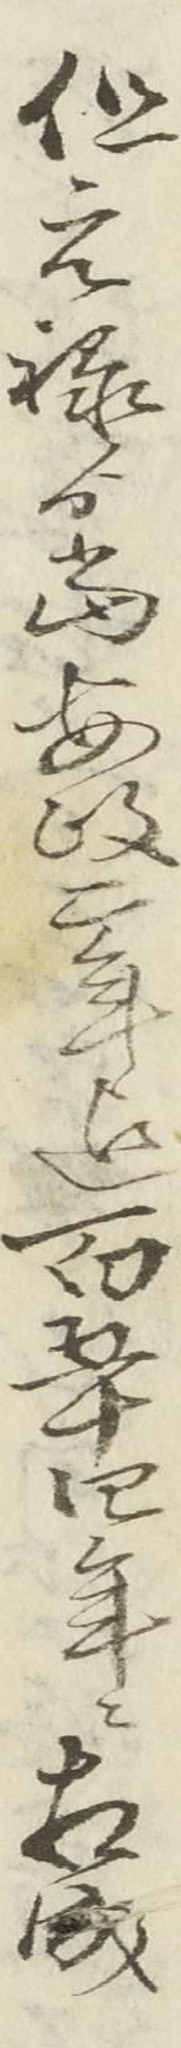但元禄ゟ当安政二年迄百五十四年ニ相成
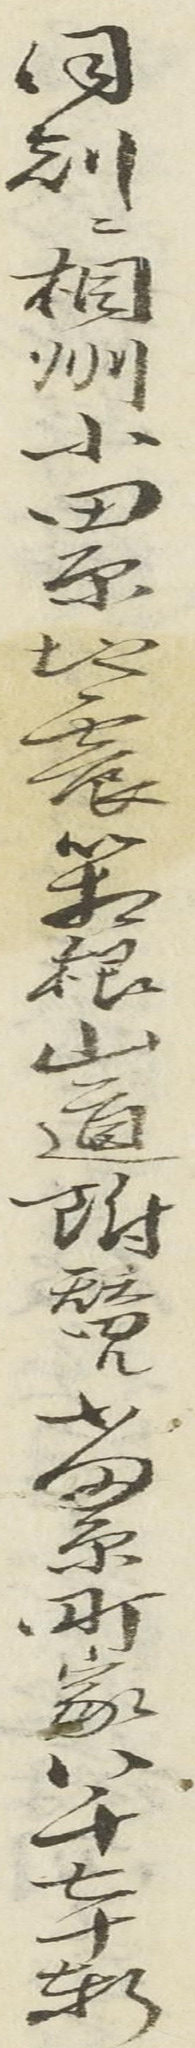同刻ニ相州小田原地震箱根山道附替ル小田原町家八千七十軒
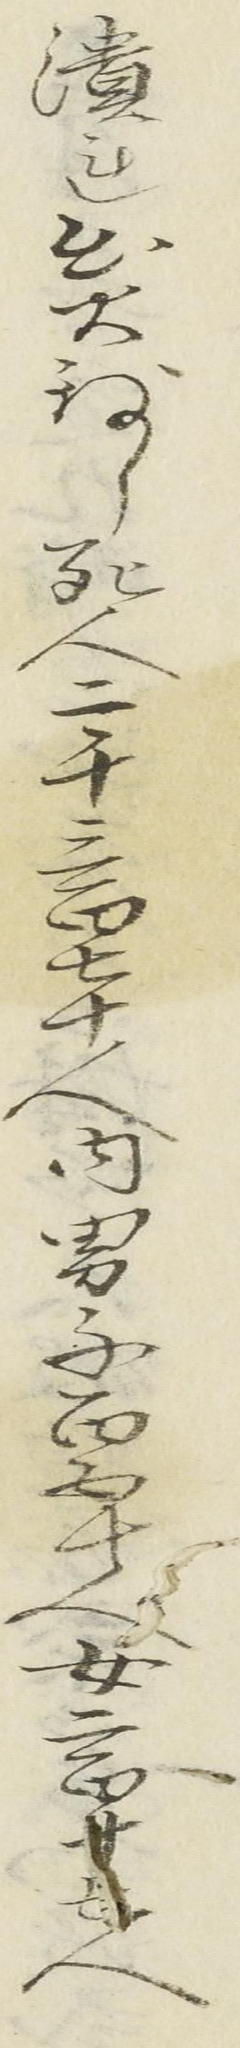潰れ出火致し死人二千三百七十人内男千百五十人女二百十七人
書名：安政二乙卯年十月二日大地震之事
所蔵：東京大学地震研究所図書室 Earthquake Research Institute Library, The University of Tokyo, JAPAN
